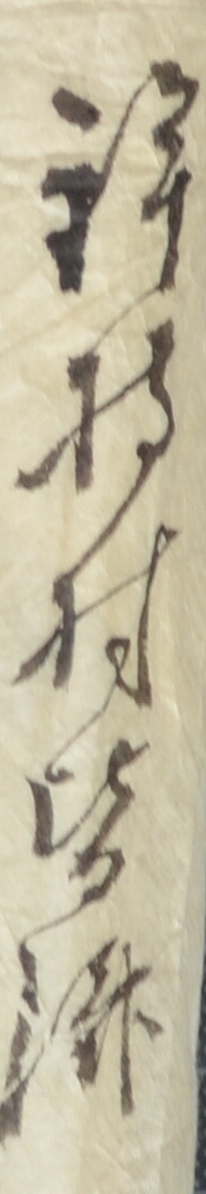鉾持村皆済

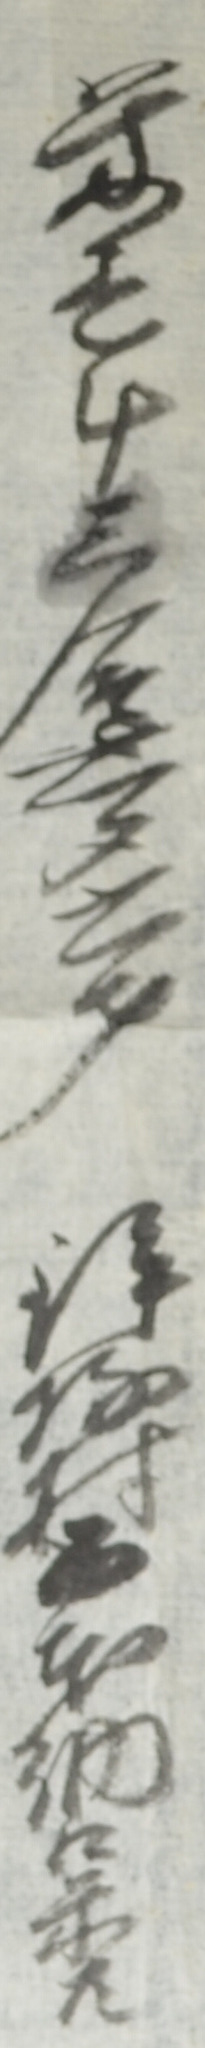米壱斗三合六勺六才鉾持村酉本納口米共
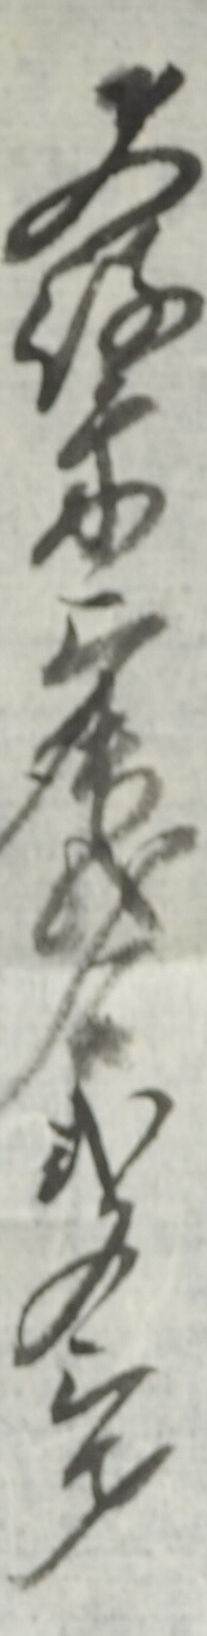夫役米三升弐合弐勺三才
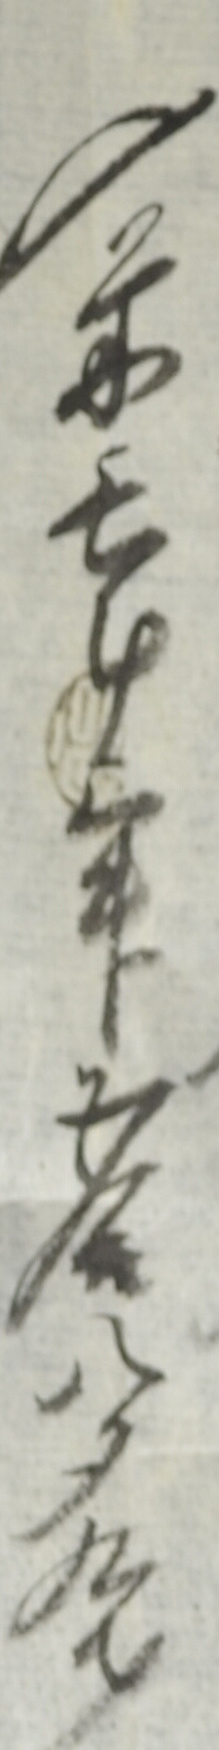〆米壱斗三升五合八勺九才
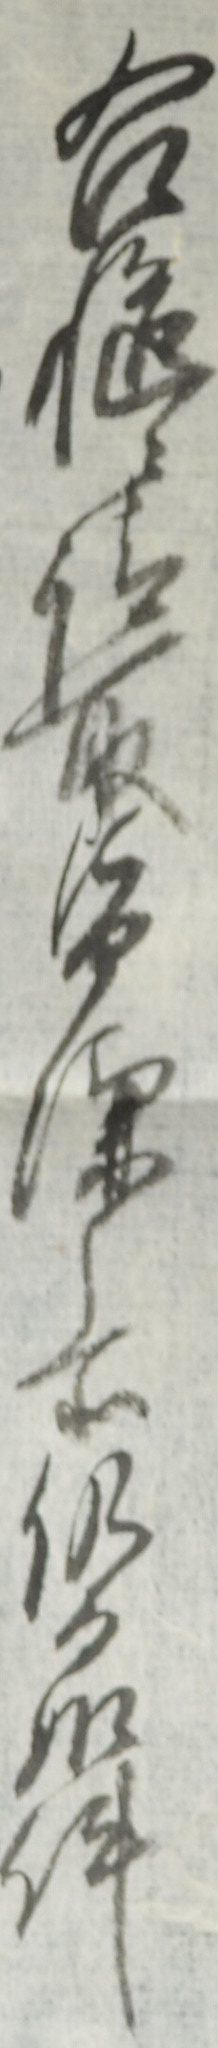右慥ニ請取皆済之所仍而如件
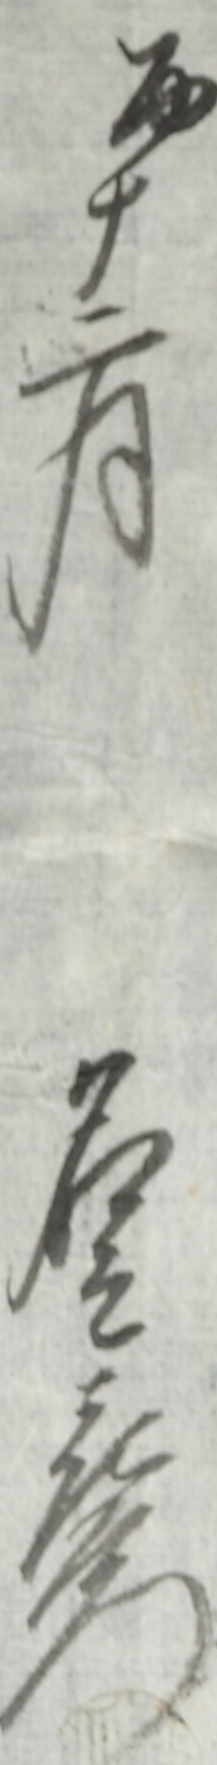酉十二月名主喜右衛門㊞
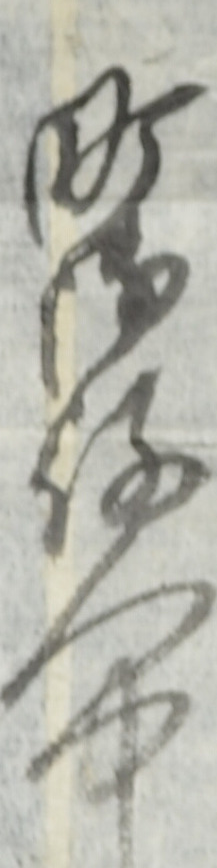町御役人中

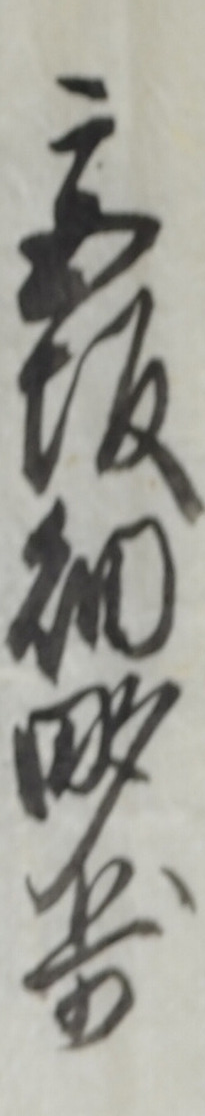宮坂畑畝歩
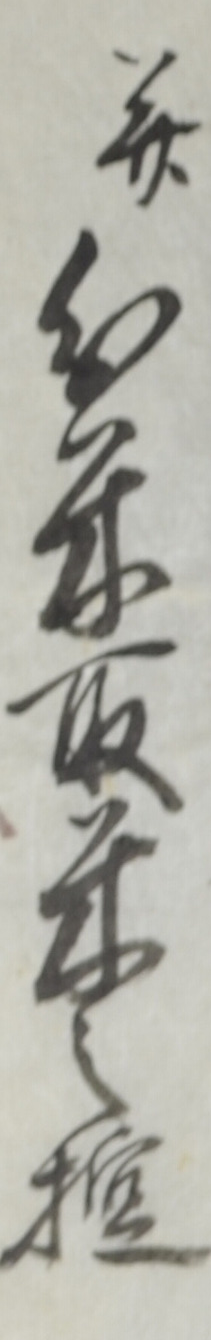并分米取米之控
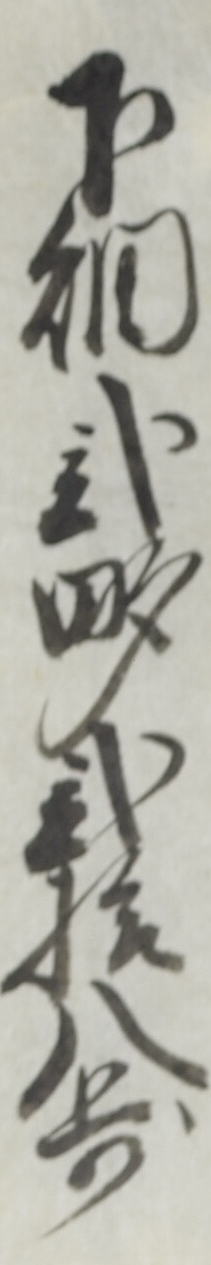下畑弐畝弐拾八歩
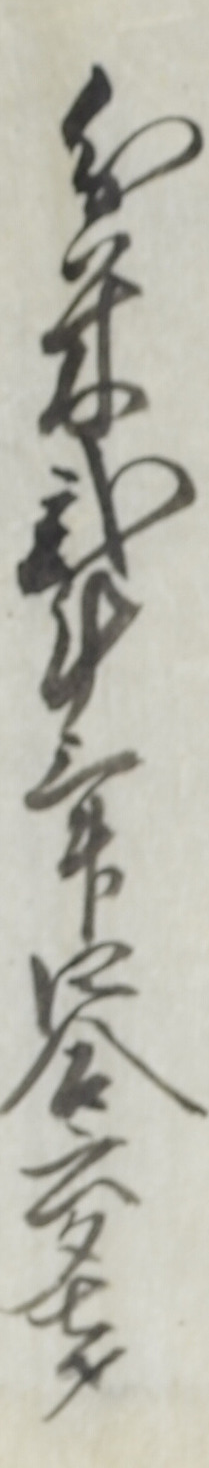分米弐斗三升四合六勺七才
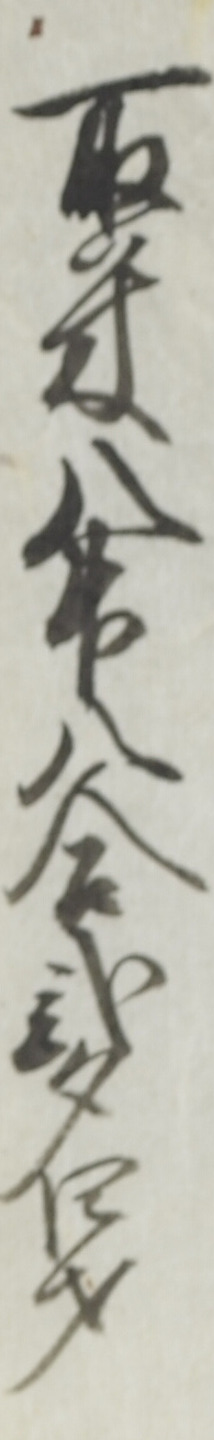取米八升八合弐勺四才
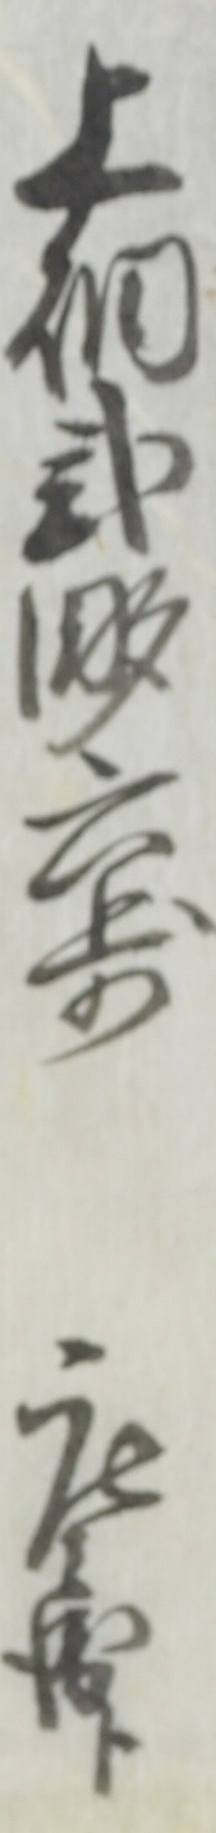上畑弐畝六歩庄兵衛分
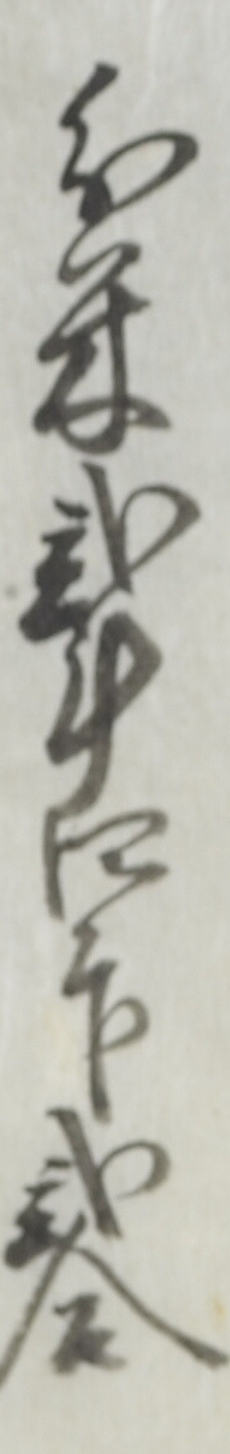分米弐斗四升弐合
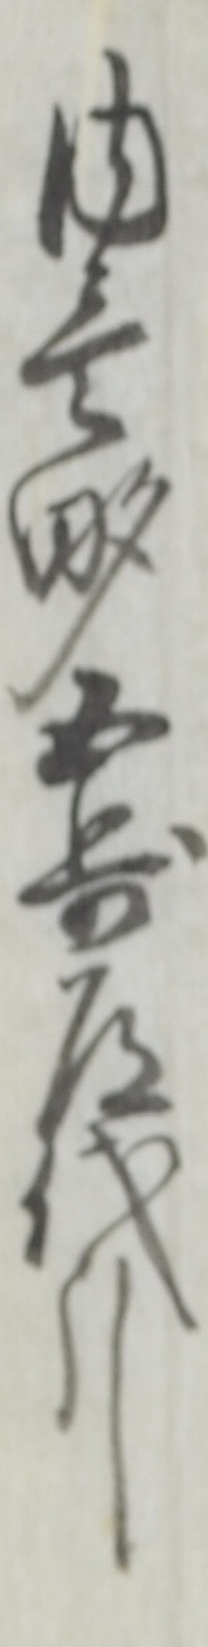内壱畝五歩道代引
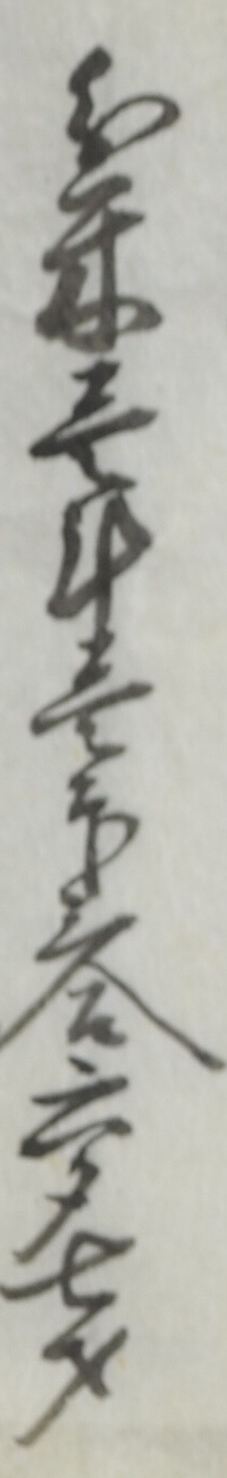分米壱斗壱升三合六勺七才
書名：鉾持村皆済権現道附替畝歩書付
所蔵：伊那市立高遠町図書館・合同会社AMANE
